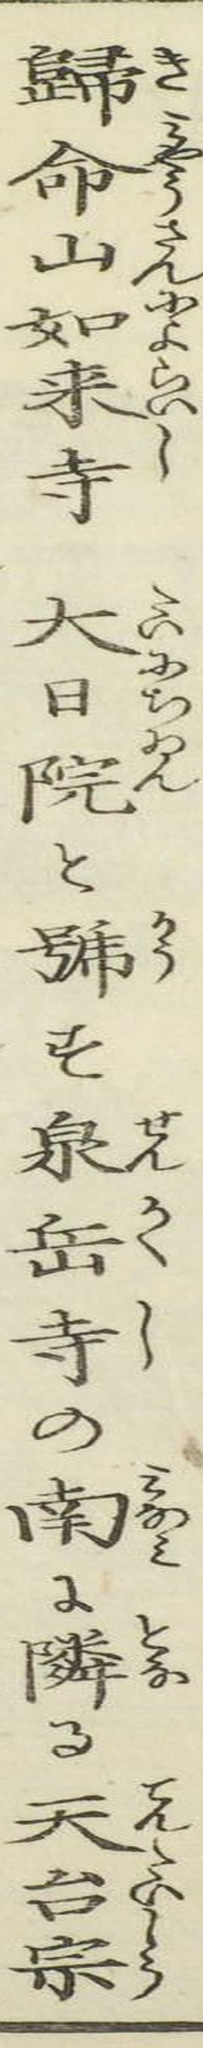歸命山如来寺大日院と号す泉岳寺の南に隣る天台宗
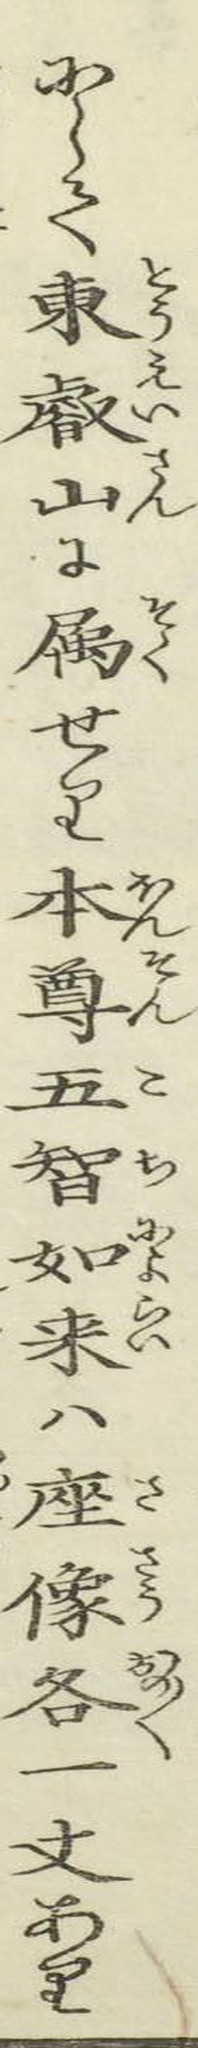にして東叡山に属せり本尊五智如来は座像各一丈あり
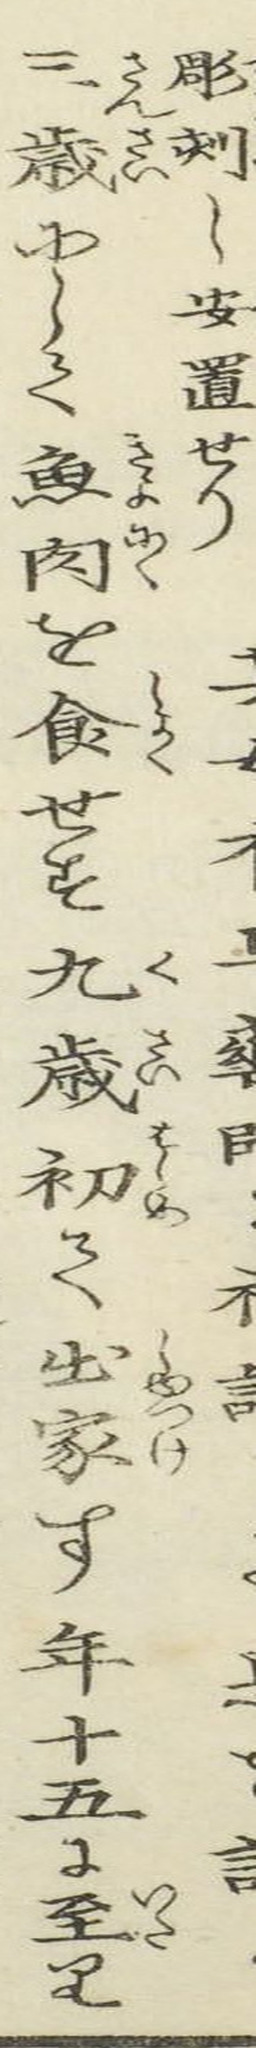三歳にして魚肉を食せす九歳初て出家す年十五に至り
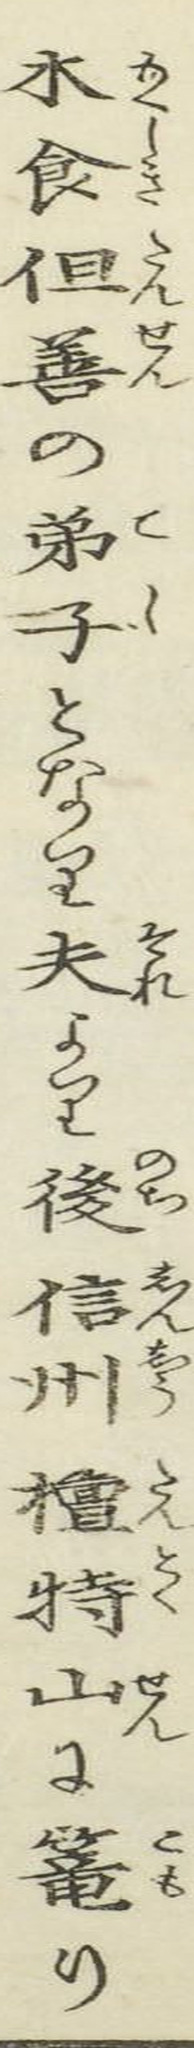木食但善の弟子となり夫より後信州檀特山に篭り
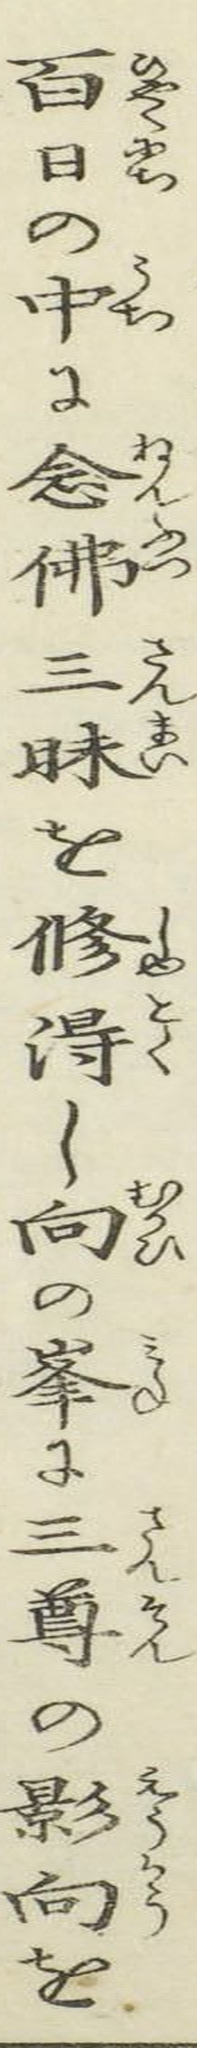百日の中に念佛三昧を修得し向の峯に三尊の影向を
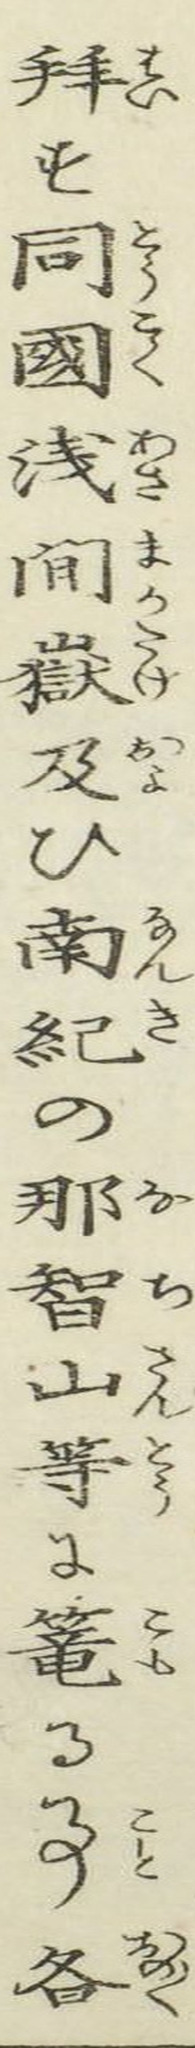拝す同國浅間嶽及ひ南紀の那智山等に篭る事各
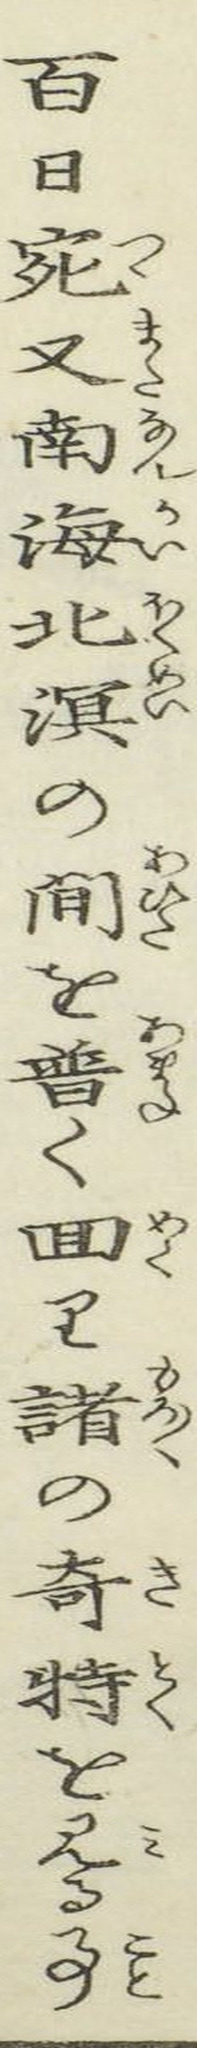百日宛又南海北溟の間を普く回り諸の奇特を見る事
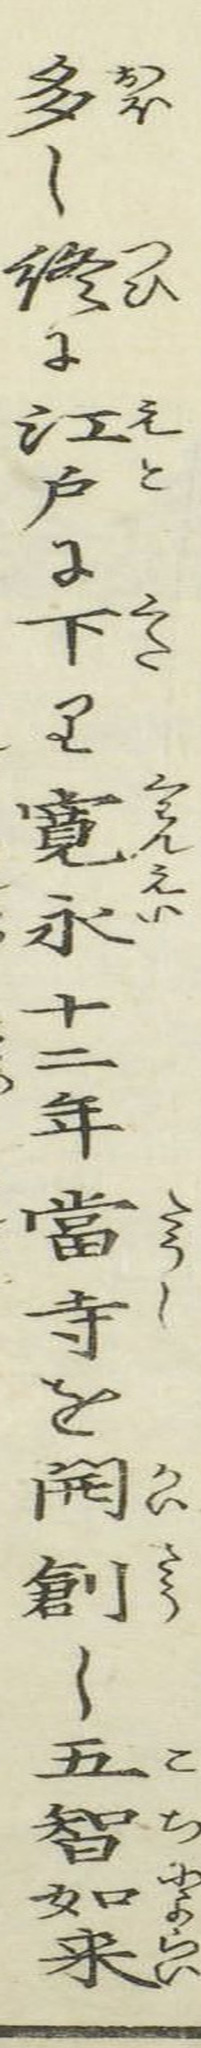多し終に江戸に下り寛永十二年當寺を開創し五智如来
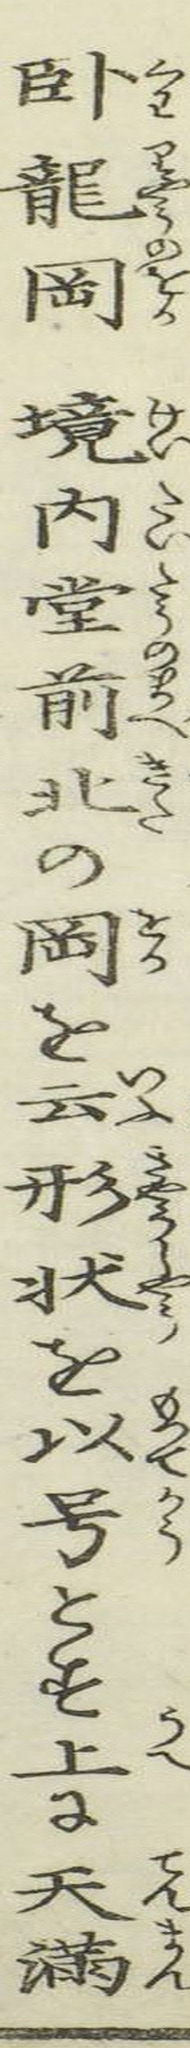臥龍岡境内堂前北の岡を云形状を以号とす上に天満
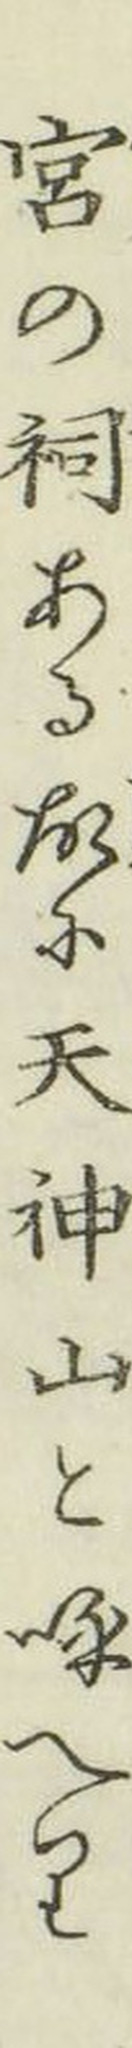宮の祠ある故に天神山と呼へり
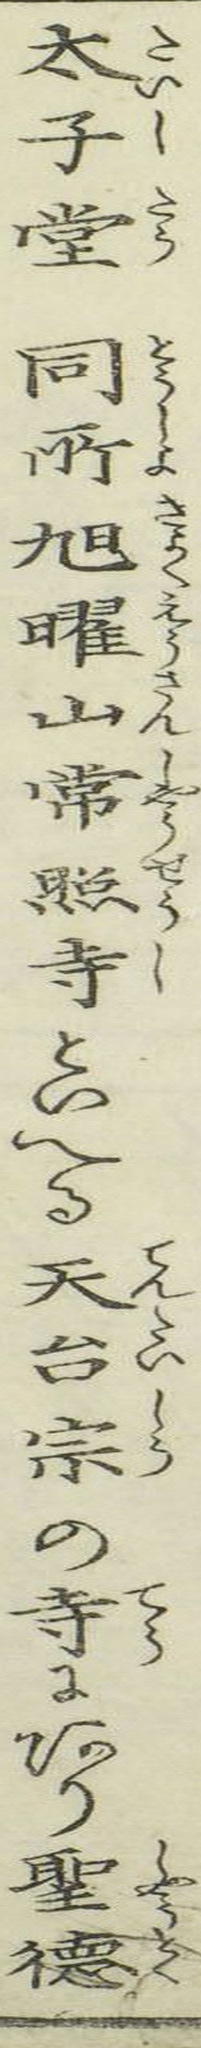太子堂同所旭曜山常照寺といへる天台宗の寺にあり聖徳
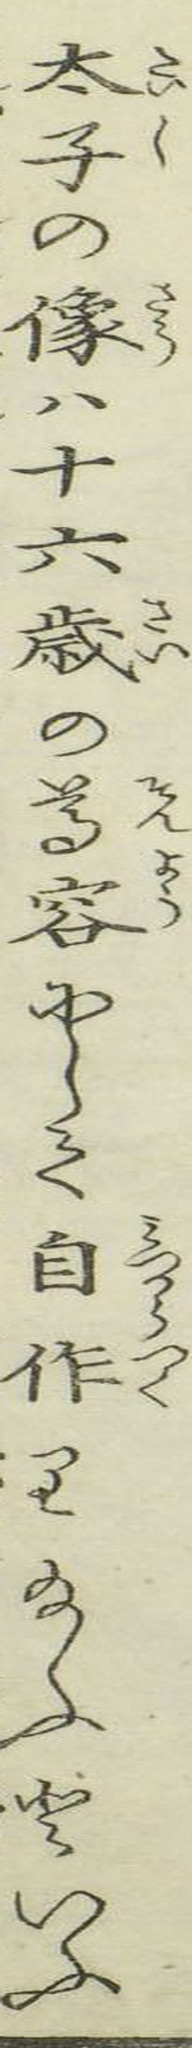太子の像は十六歳の尊容にして自作り給ふといふ

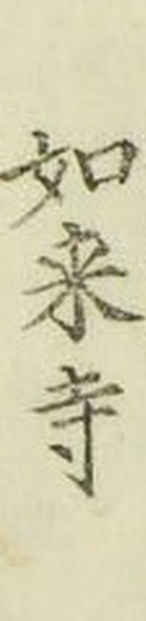如来寺

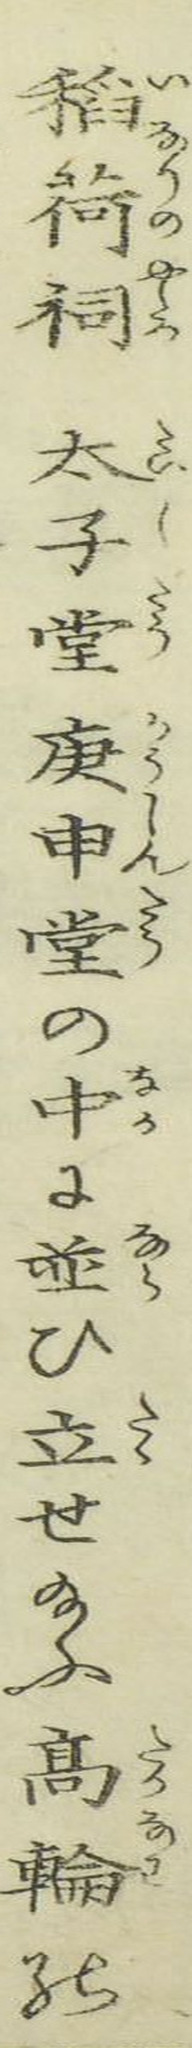稲荷祠太子堂庚申堂の中に並ひ立せ給ふ高輪の
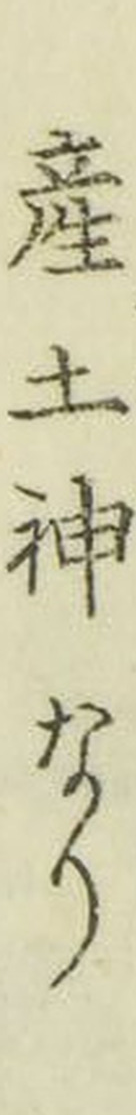産土神なり
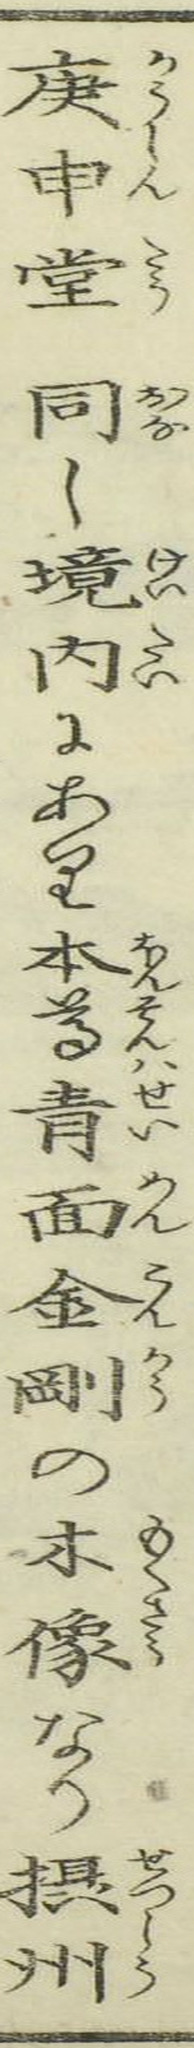庚申堂同し境内にあり本尊青面金剛の木像なり摂州
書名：江戸名所図会 20巻 巻之3
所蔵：東京学芸大学教育コンテンツアーカイブ
